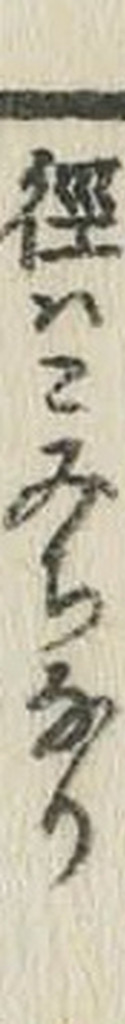径はこみちなり
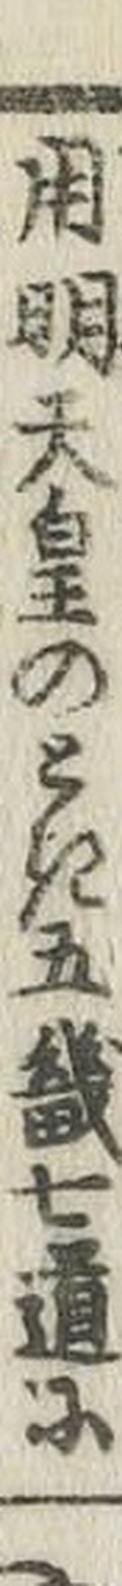用明天皇のとき五畿七道に
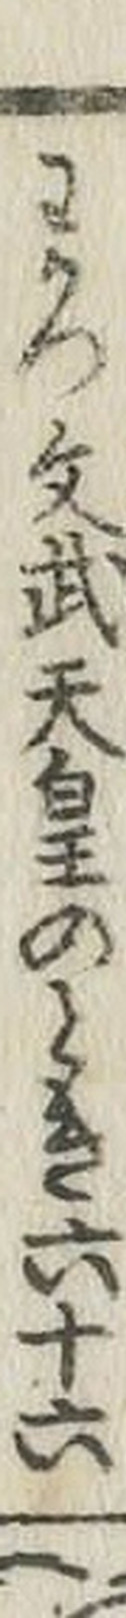わかつ文武天皇のとき六十六
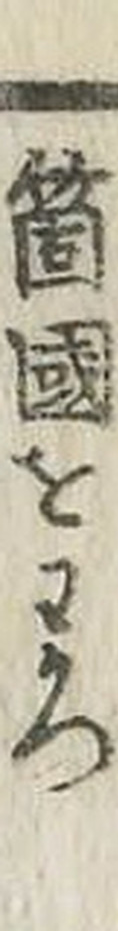箇国をわかつ
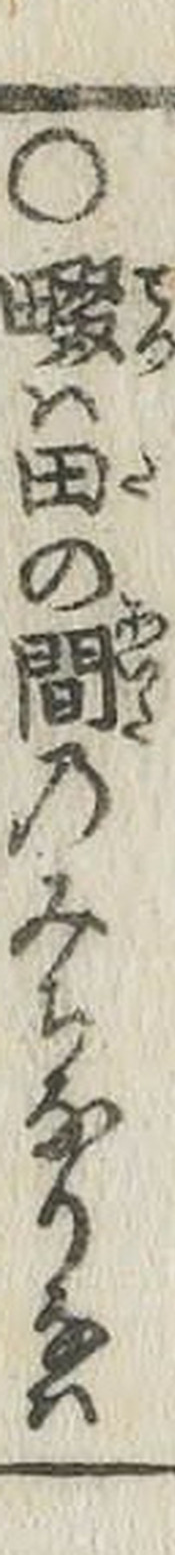○畷は田の間のみちなりなは
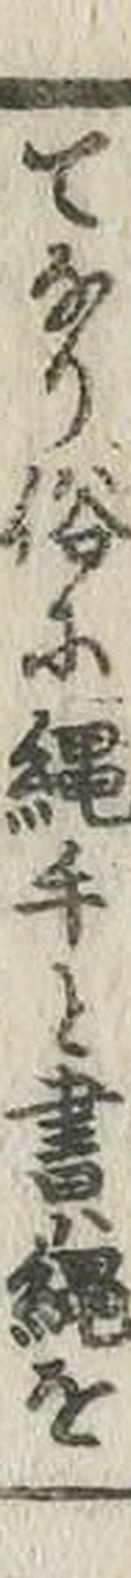てなり俗に縄手と書は縄を
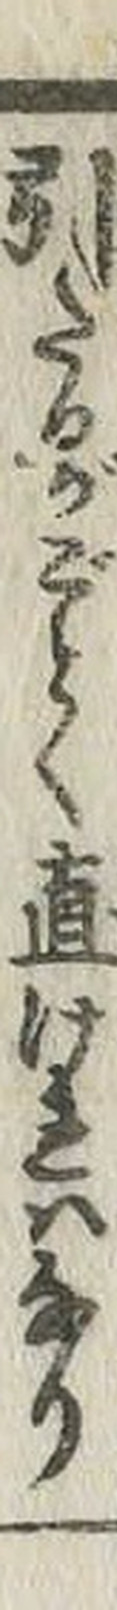引たるがごとく直けれはなり
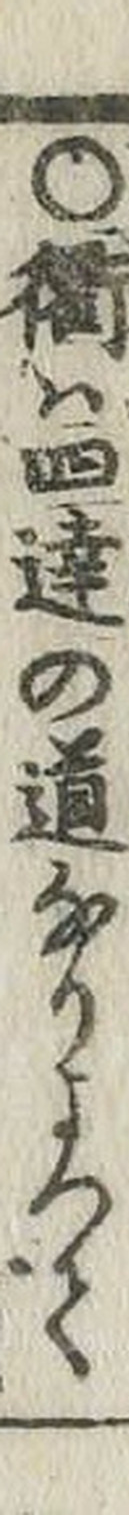○衢は四達の道なりよつて
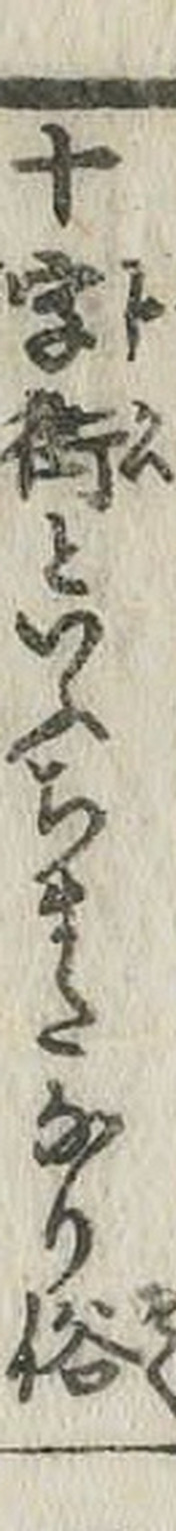十字街といふちまたなり俗
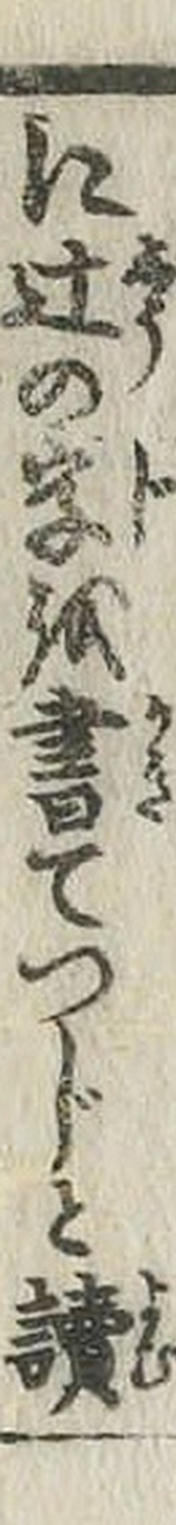に辻の字を書てつじと読
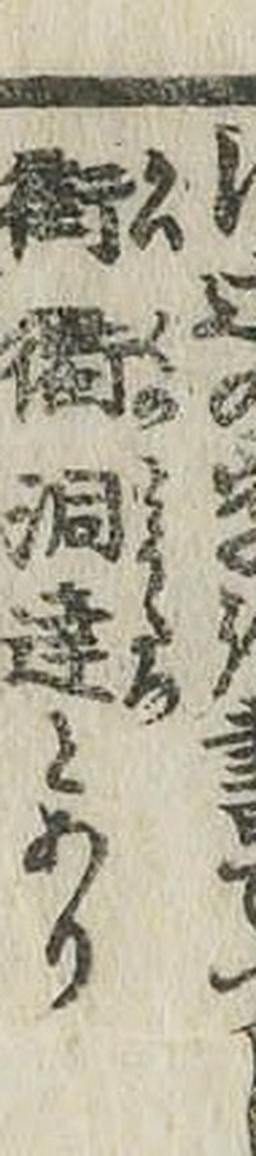街衢洞達とあり
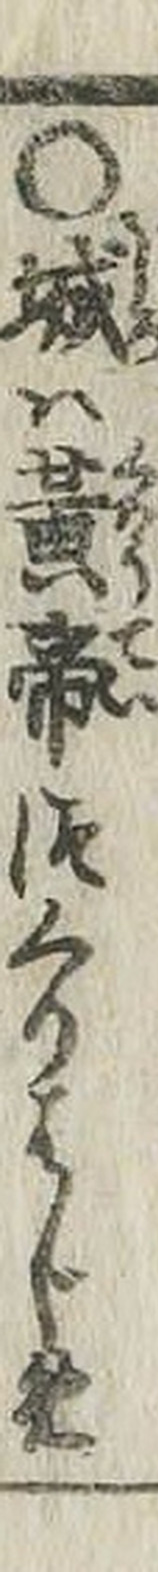○城は黄帝つくりはじめ
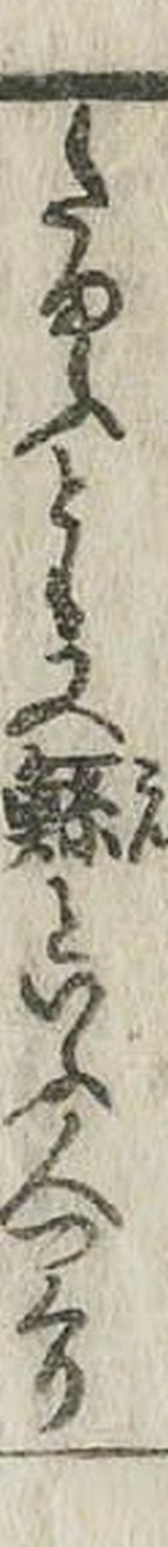たまふとも又鯀といふ人つくり
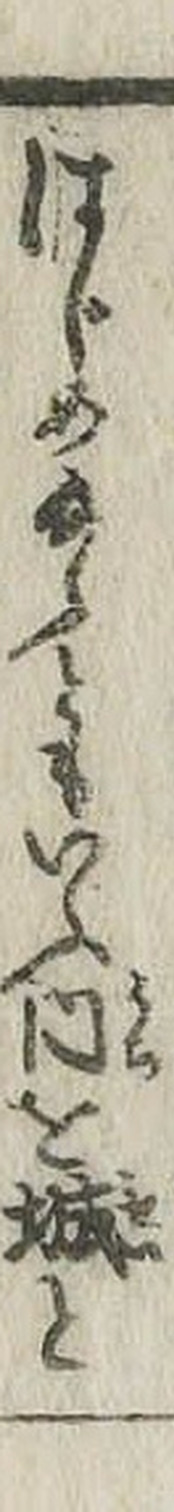はじめ給ふともいふ内を城と
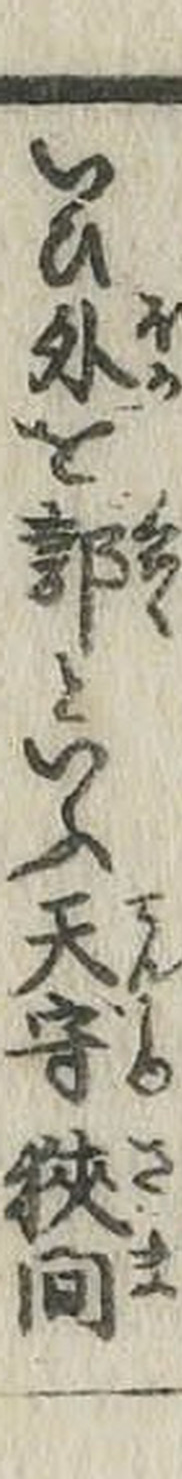いひ外を郭といふ天守狭間

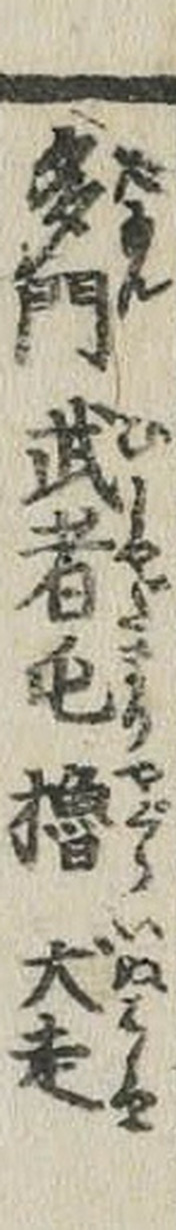多門武者屯櫓犬走
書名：増補頭書訓蒙図彙大成 10巻 2:巻之1-3
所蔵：東京学芸大学教育コンテンツアーカイブ
